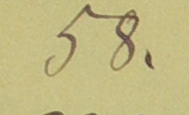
58
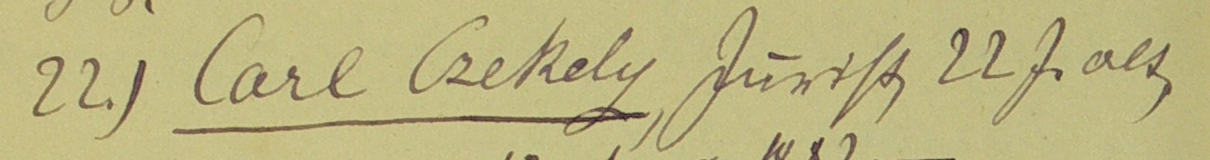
22.) Carl Czekely, Jurist 22 J. alt
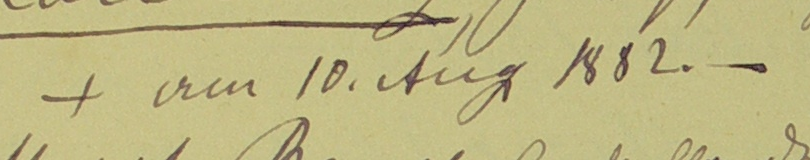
am 10 Aug. 82
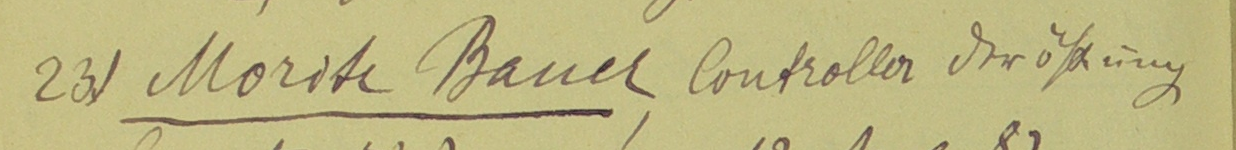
23.) Moritz Bauer, Controller der öster.
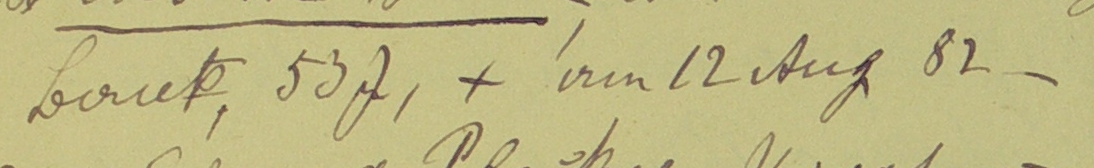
Bank 53 J. am12 Aug. 82
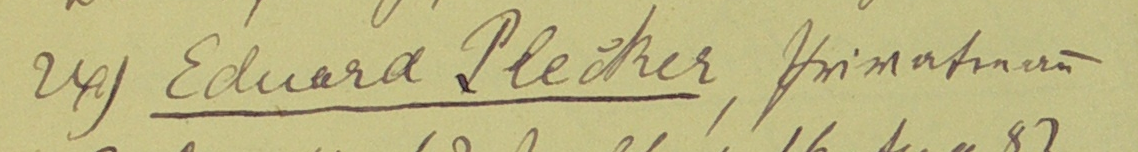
24.) Eduard Plecker, Priwatmann
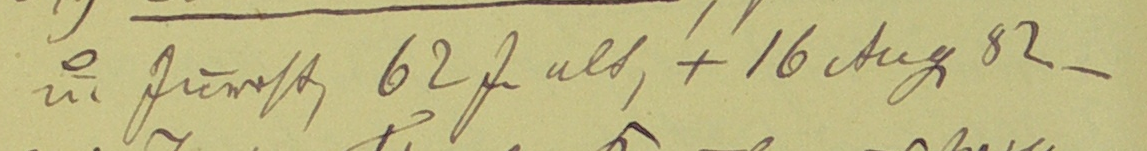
Jurist, 62 J. alt am16 Aug. 82
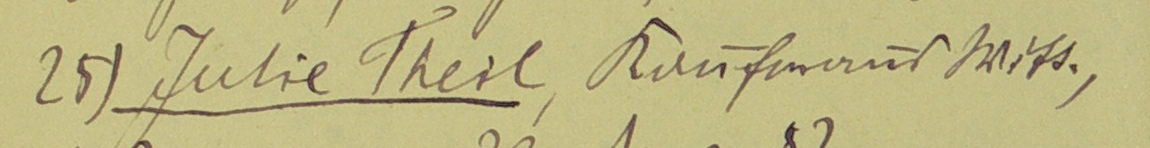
25.) Julie Theil, kaufmanns Witwe,
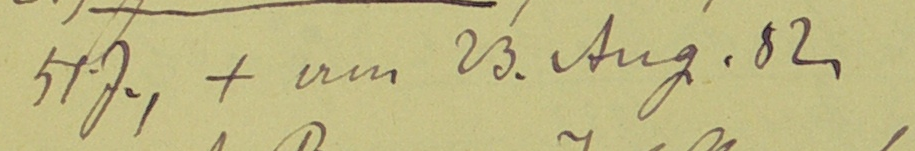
51 J. alt + am23 Aug. 82
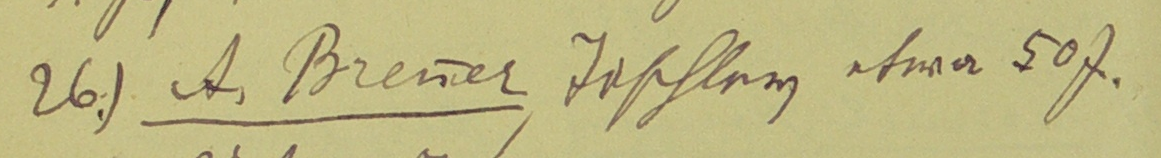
26.) A. Breuer, Tischler, etwa 50 J. alt
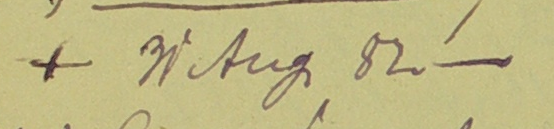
+ am 31 Aug. 82
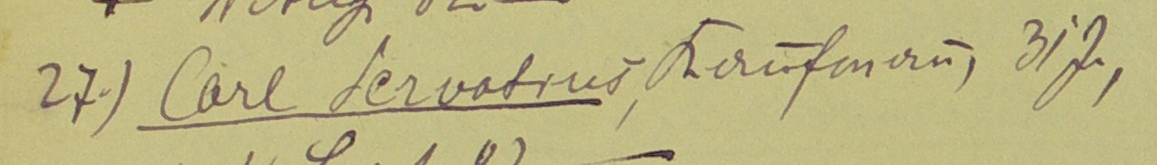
27.) Carl Servatius, Kaufmann, 31 J.
